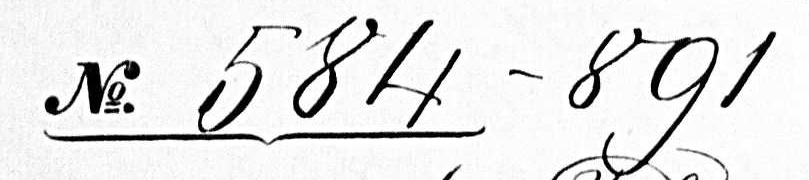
No. 584 – 1891
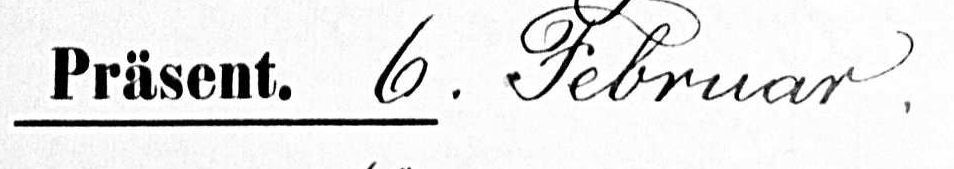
Präsent. 6. Februar
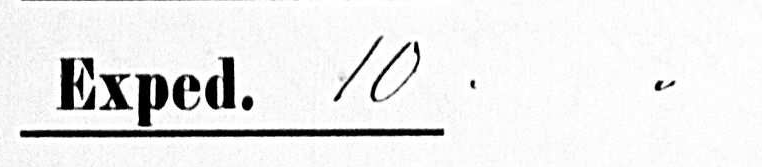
Expedit 10. Februar
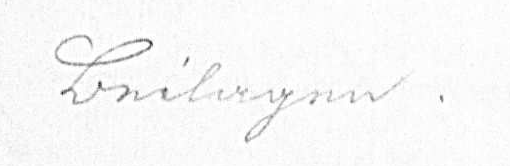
Beilagen
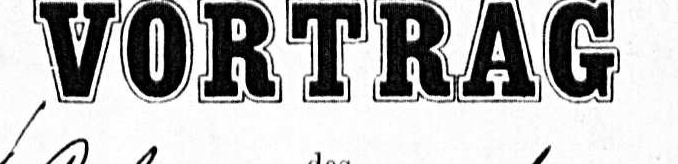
VORTRAG
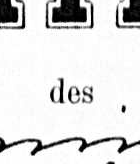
Des
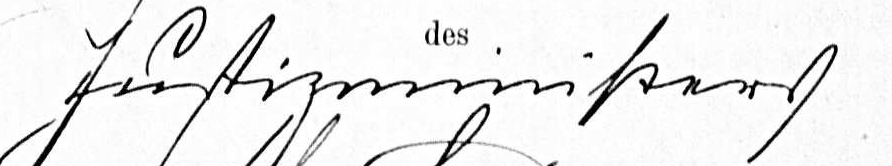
Justizministers
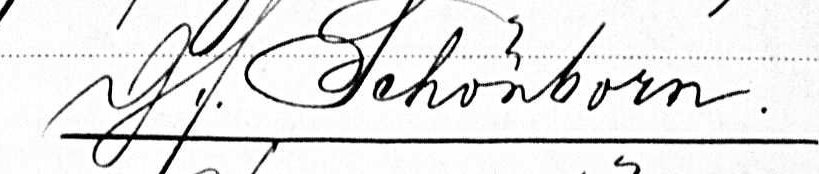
Gf Schönborn
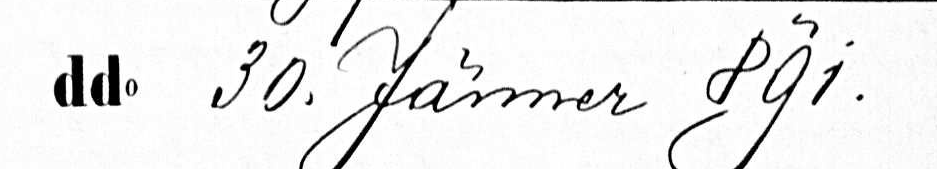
Ddo 30 Jänner 1891
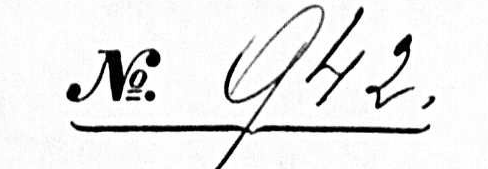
No 942
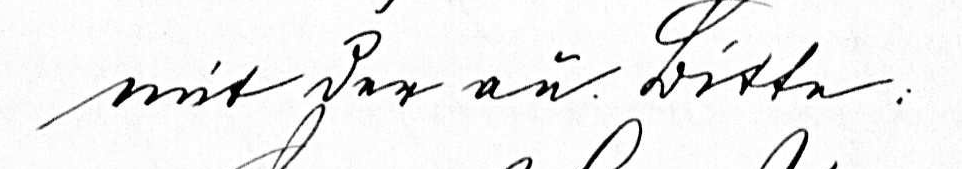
mit der au. Bitte:
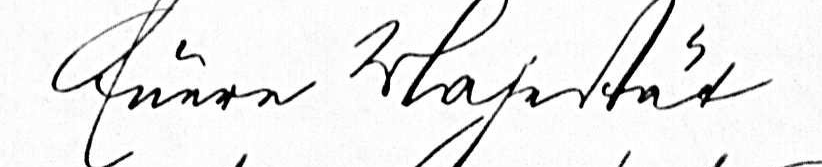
Euere Majestät
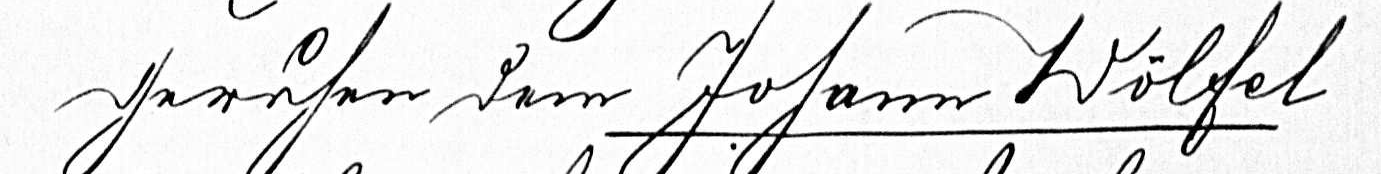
geruhen dem Johann Wölfel
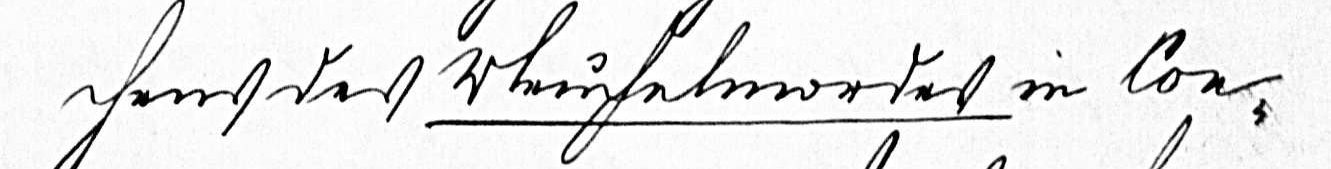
chens des Meuchelmordes in Con¬
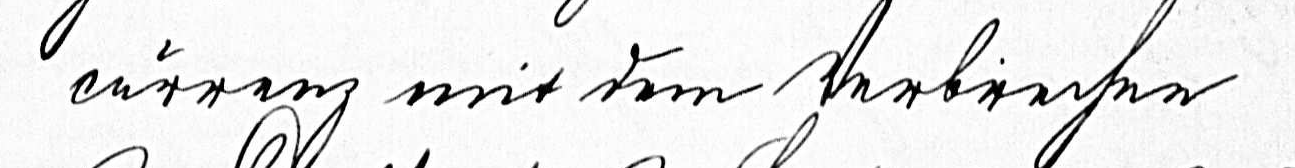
currenz mit dem Verbrechen
